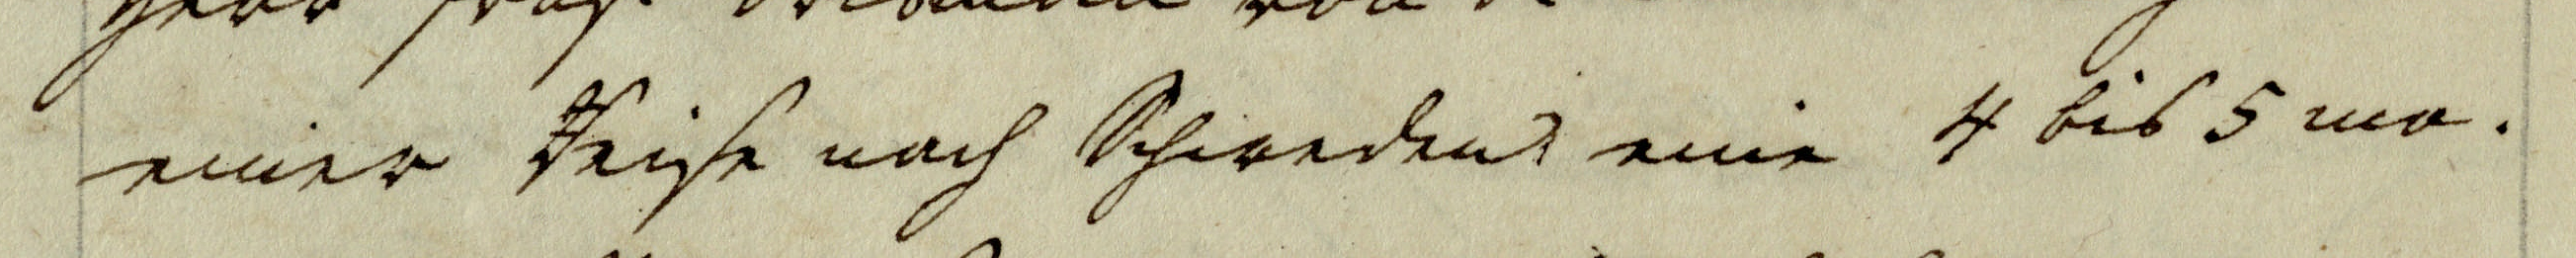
einer Reise nach Schweden eine 4 bis 5 mo
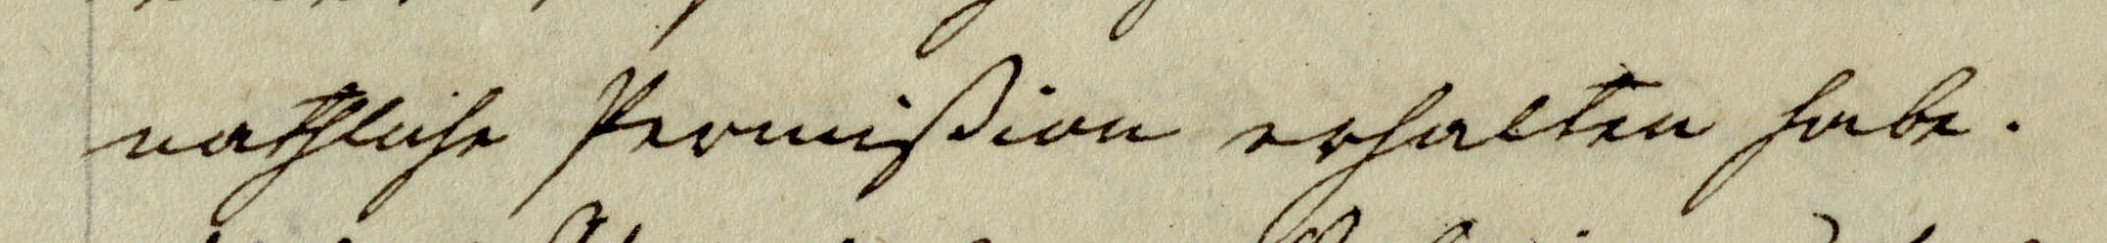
nathliche Permißion erhalten habe.
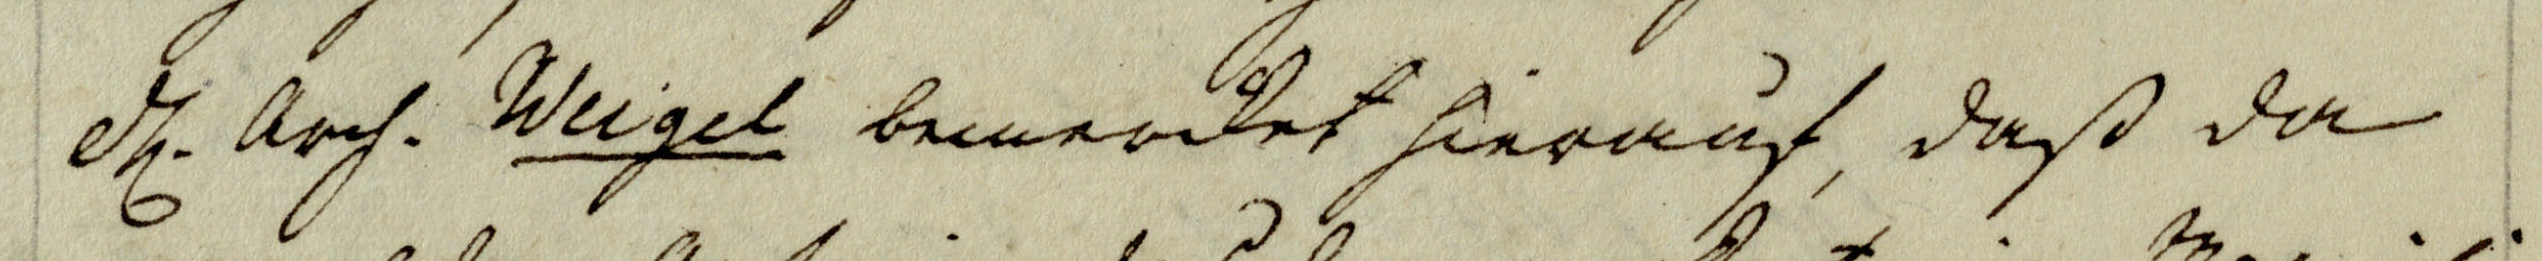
dh. Prof. Weigel bemercket hierauf, daß da
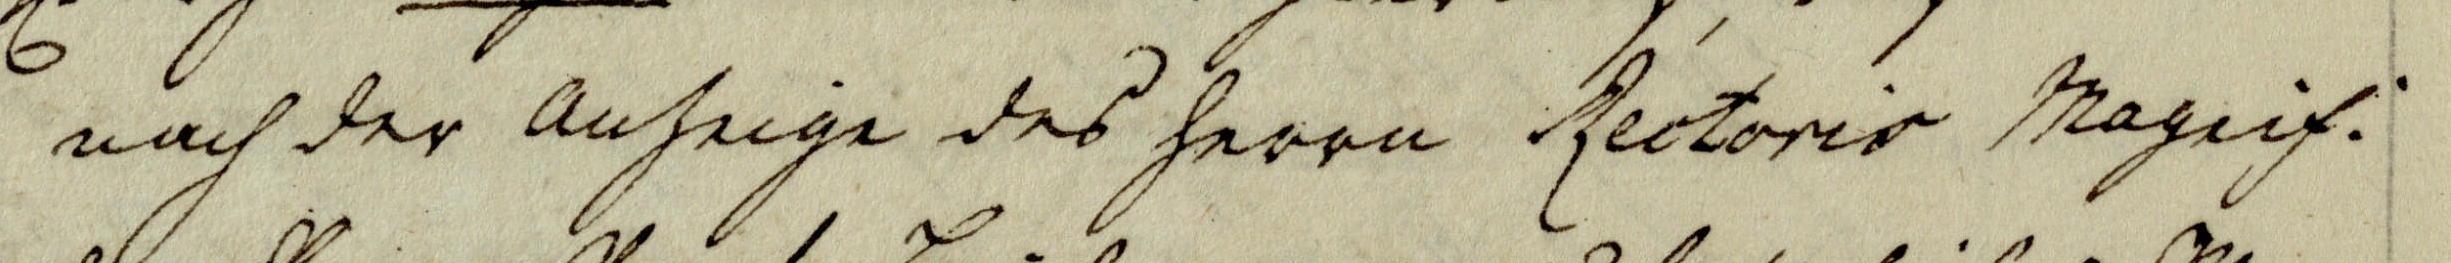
nach der Anzeige des Herrn Rectoris Magnif.
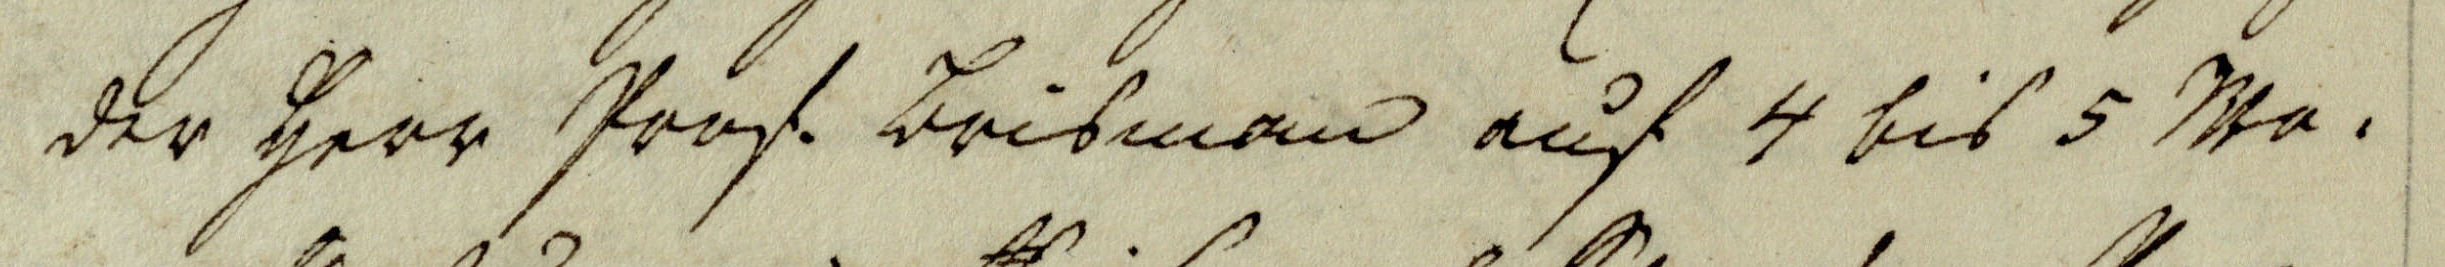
der Herr Prof. Brisman auf 4 bis 5 Mo¬
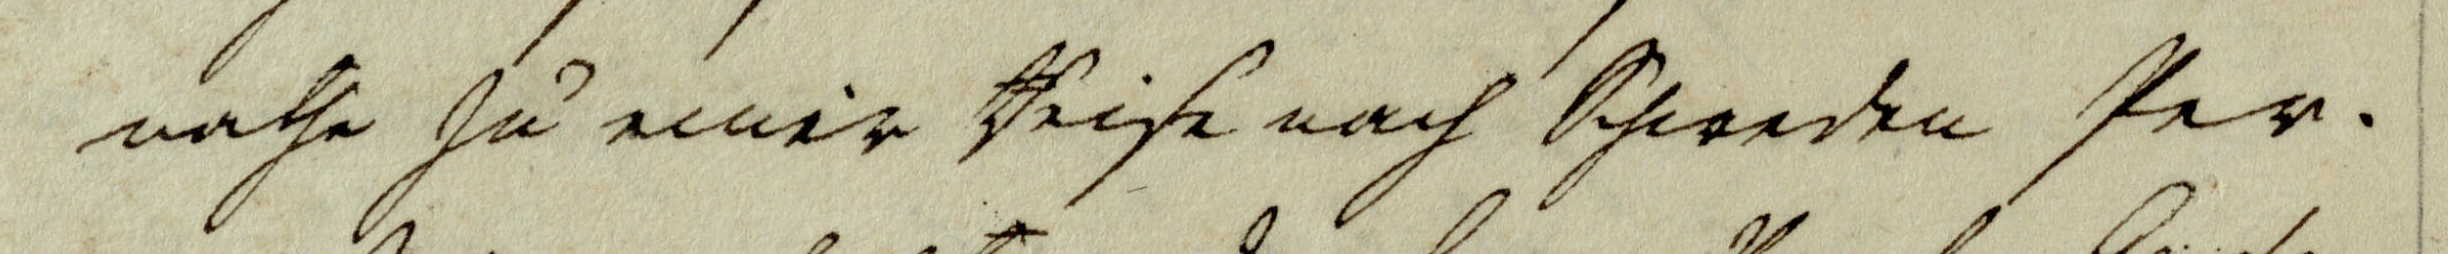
nathe zu einer Reise nach Schweden Per¬
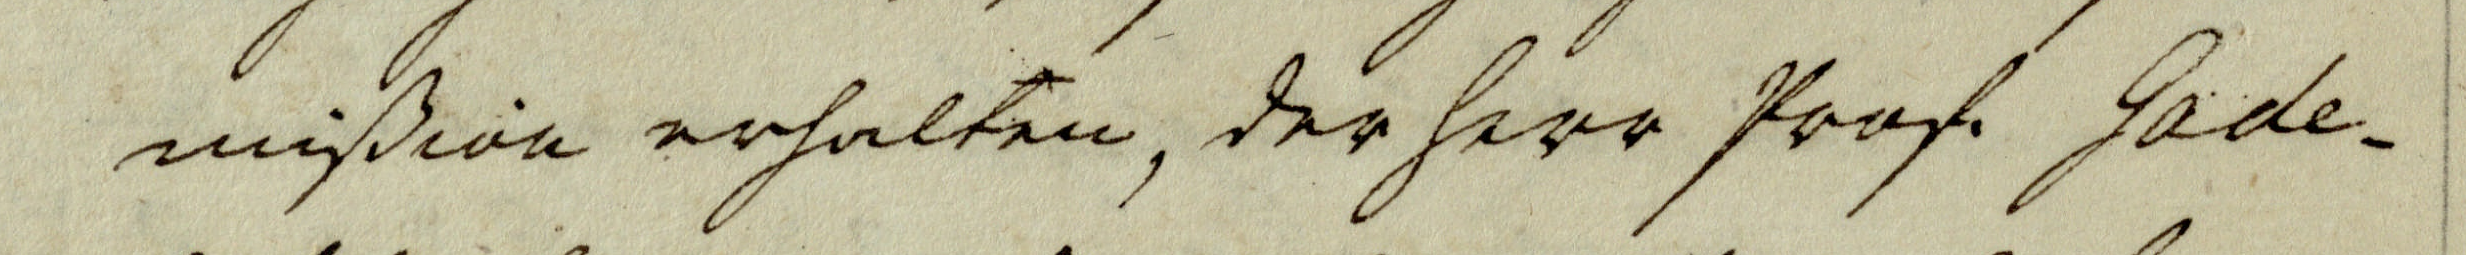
mißion erhalten, der Herr Prof. Gade¬
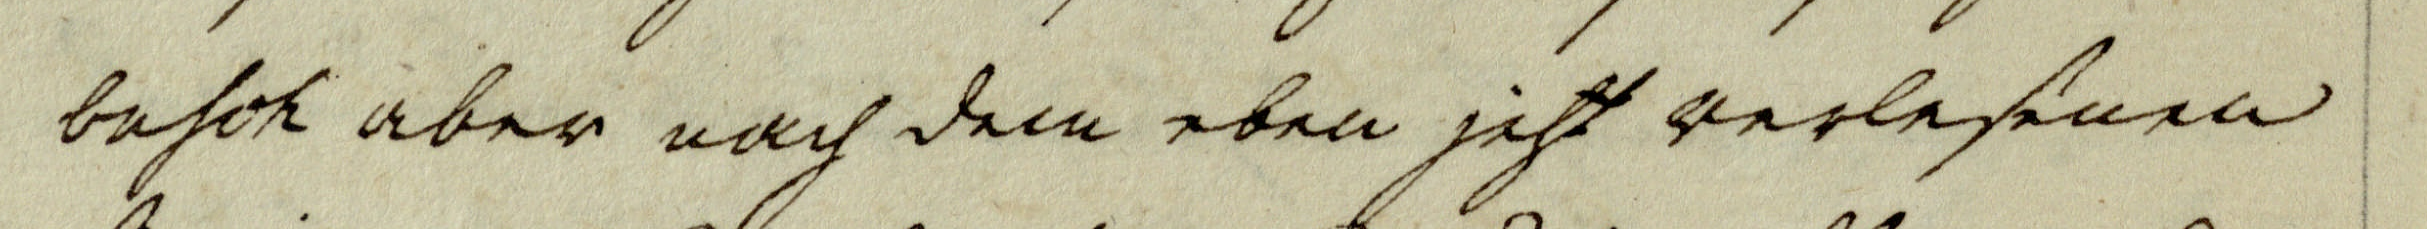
busch aber nach dem eben jetzt verlesenen
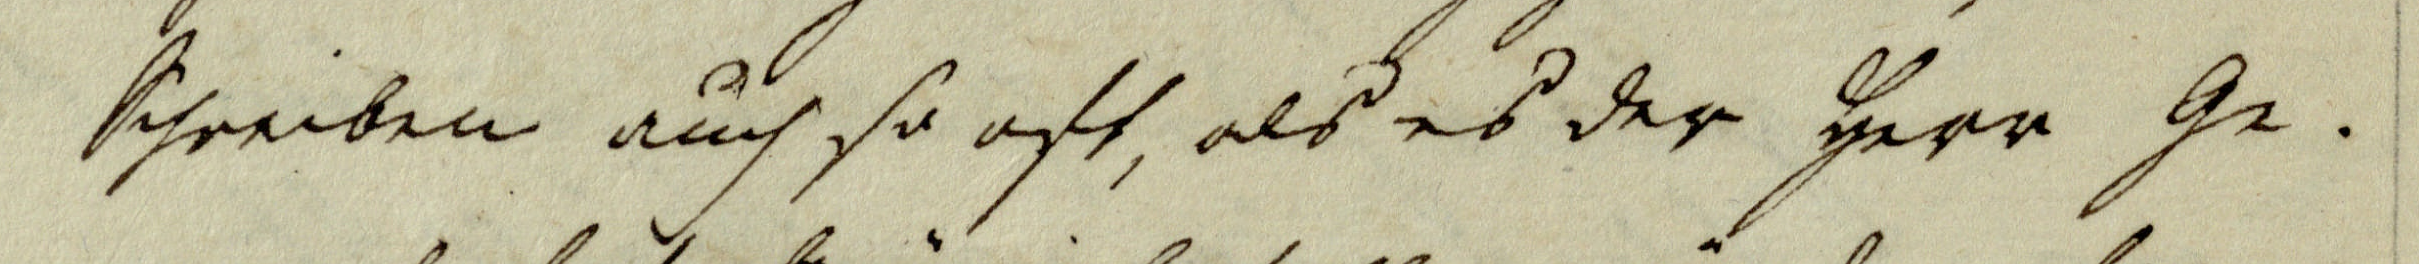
Schreiben auch so oft, als es der Herr Ge¬
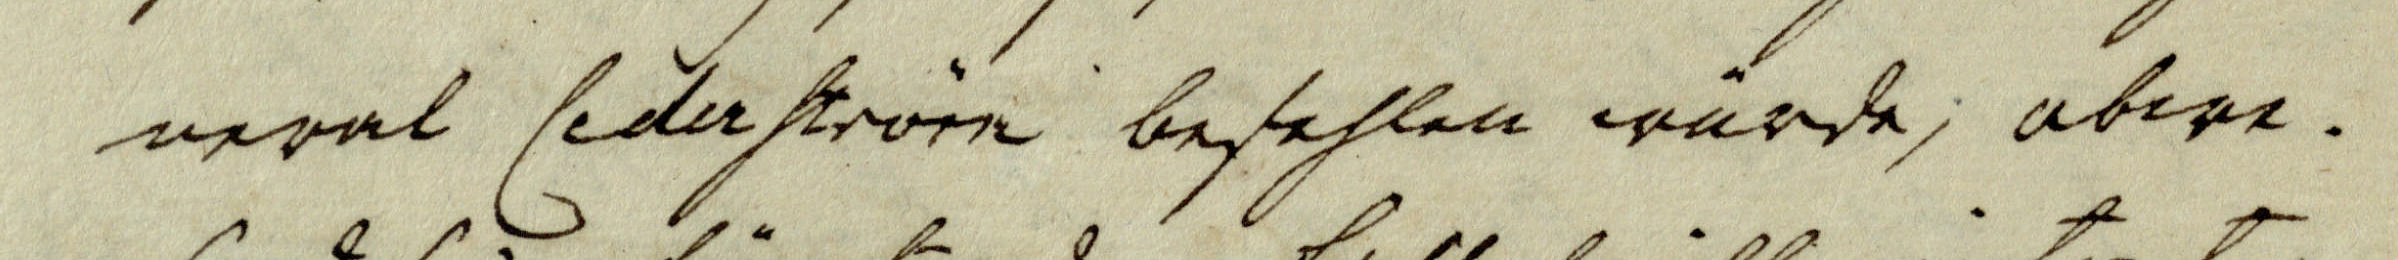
neral Cederström befehlen würde, abwe¬
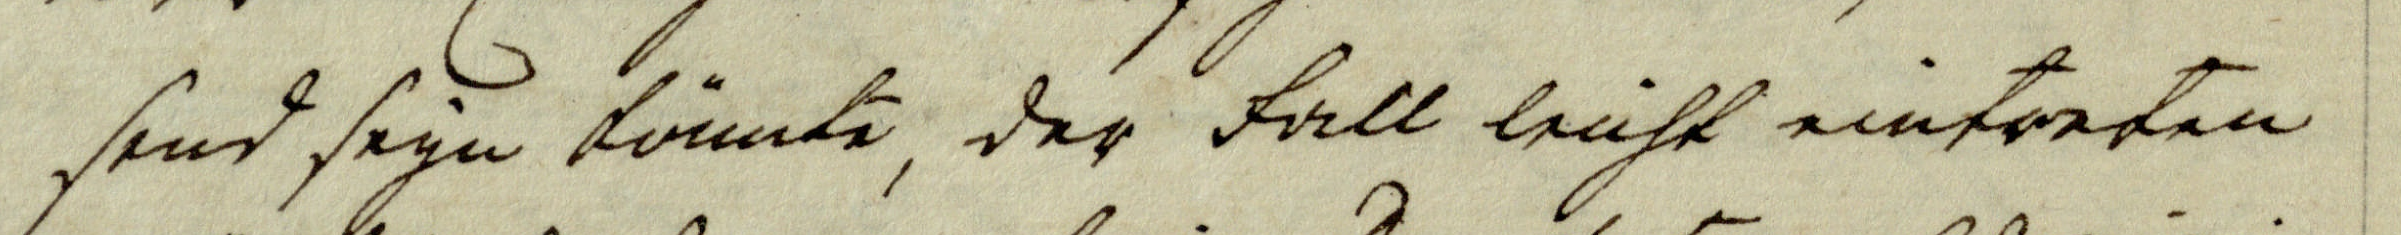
send seÿn könnte, der Fall leicht eintreten
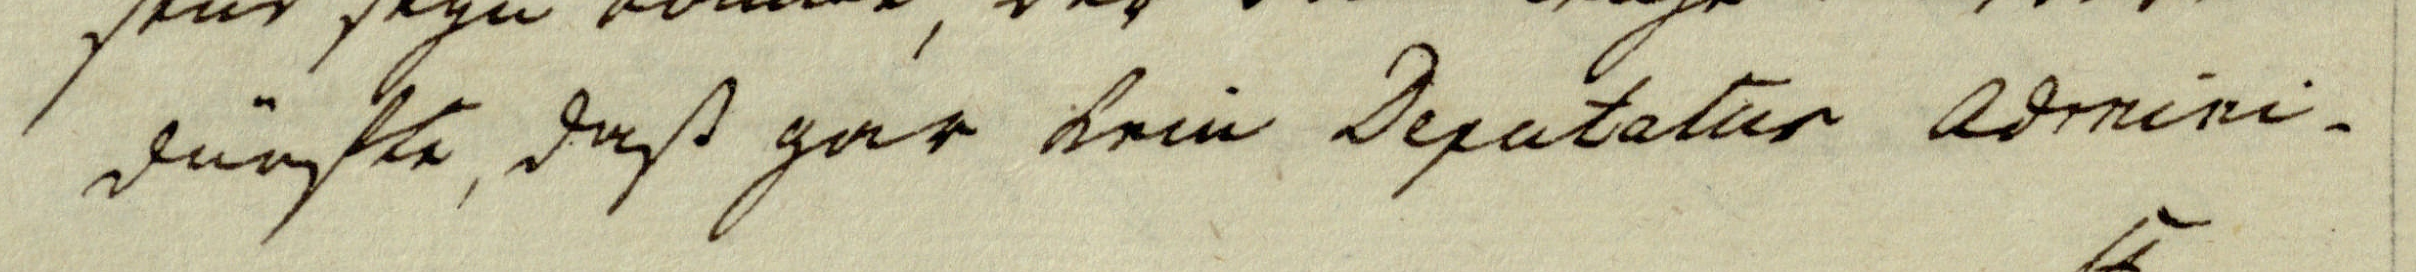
dürfte, daß gar kein Deputatus Admini¬
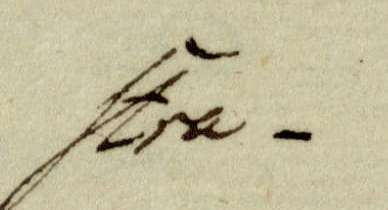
stra¬
